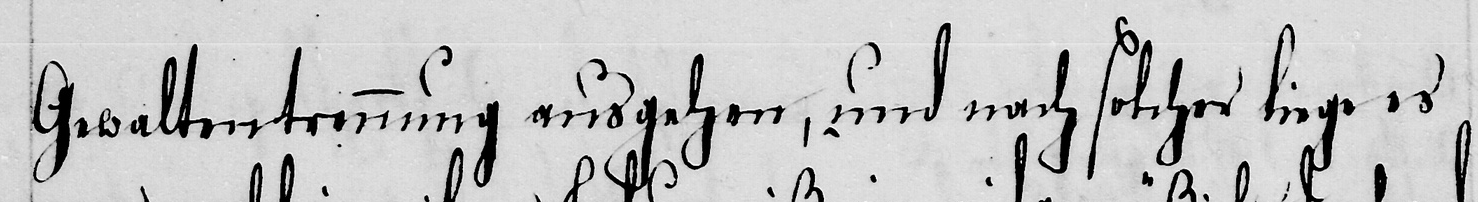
Gewaltentrennung ausgehen, und nach solcher liege es
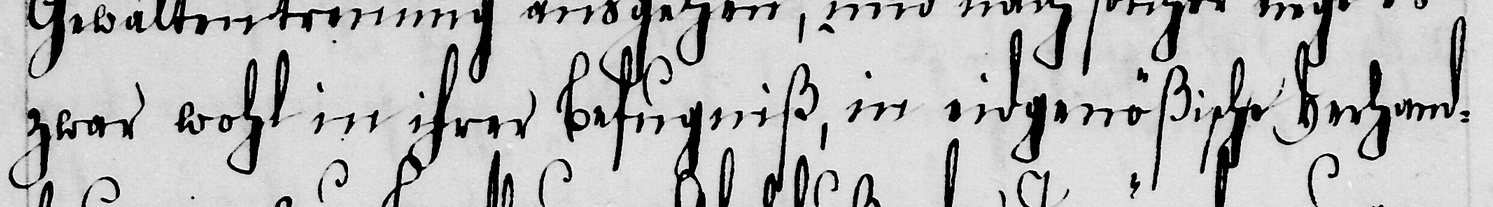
zwar wohl in ihrer Befugniß, in eidgenößische Verhand¬
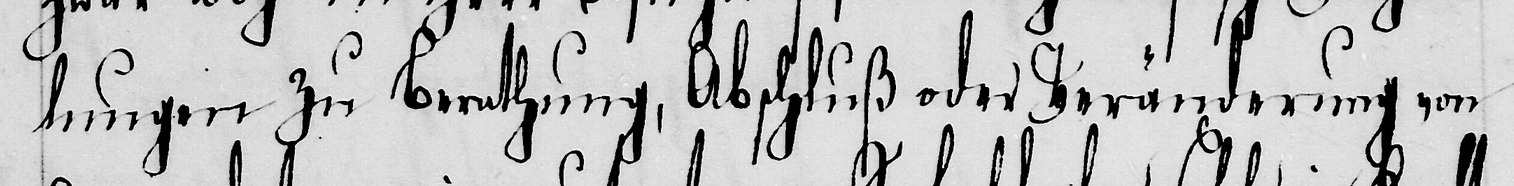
lungen zu Berathung, Abschluß oder Veränderung von
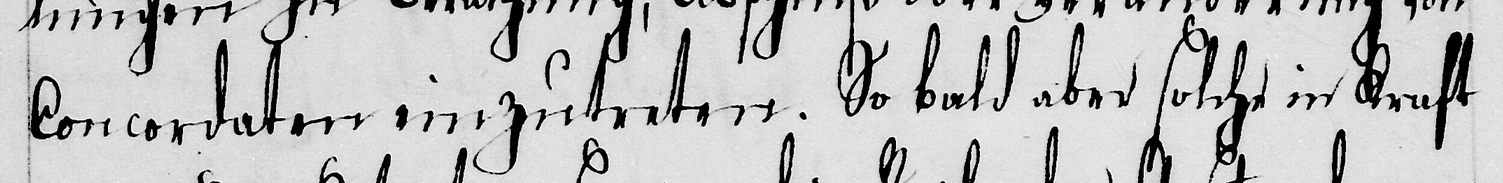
Concordaten einzutreten. So bald aber solche in Kraft
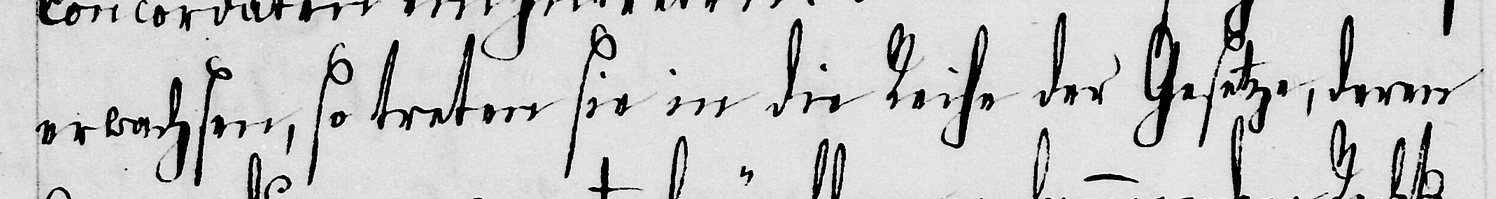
erwachsen, so treten sie in die Reihe der Gesetze, deren
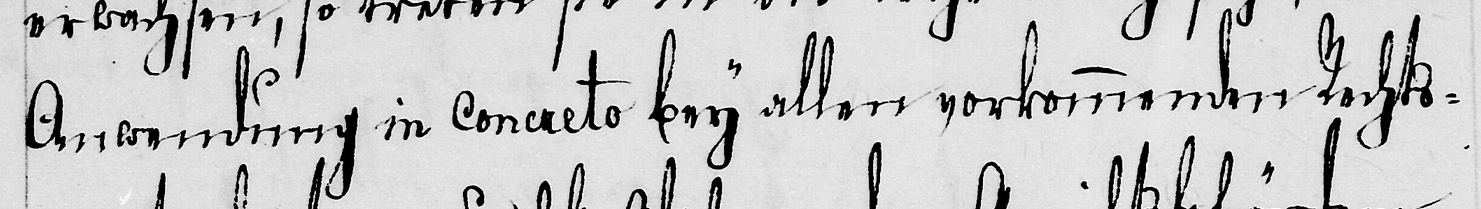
Anwendung in concreto bey allen vorkommenden Rechts¬
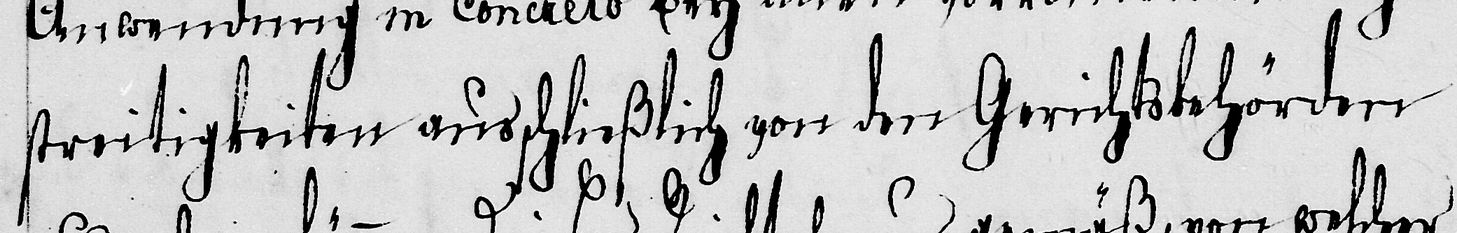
streitigkeiten ausschließlich von den Gerichtsbehörden
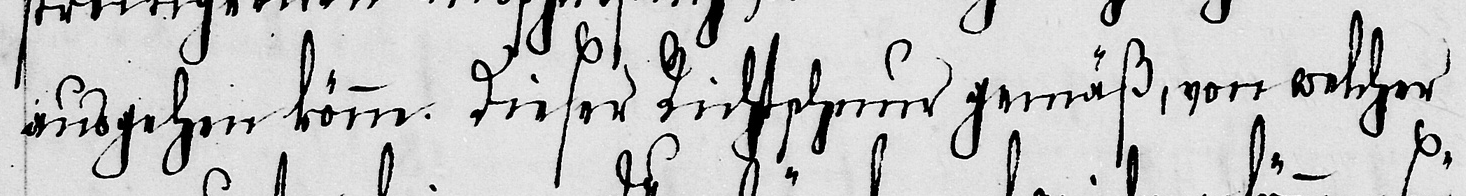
ausgehen könne. Dieser Richtschnur gemäß, von welcher
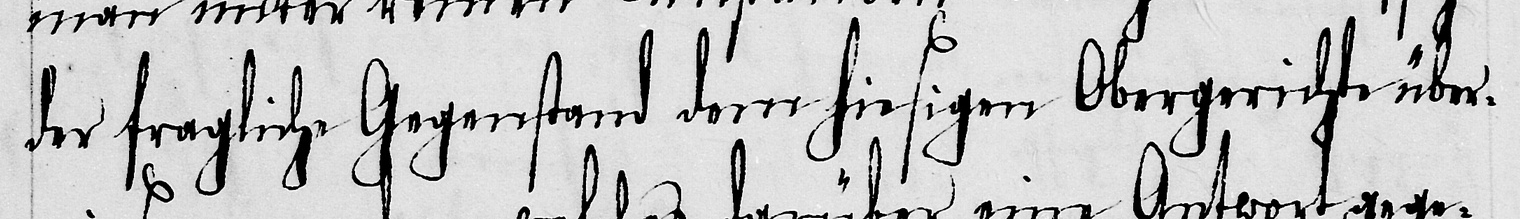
der fragliche Gegenstand dem hiesigen Obergerichte über¬
